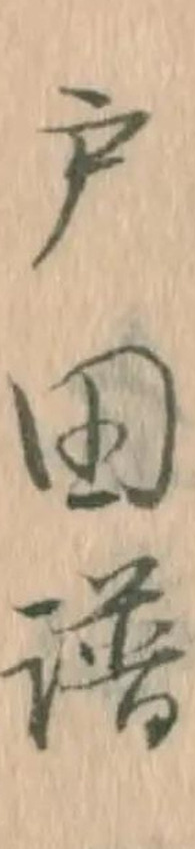戸田譜
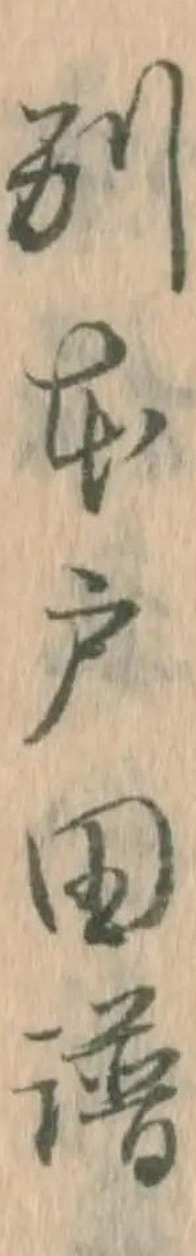別本戸田譜
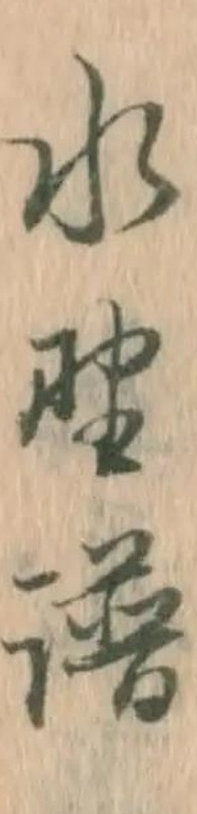水野譜
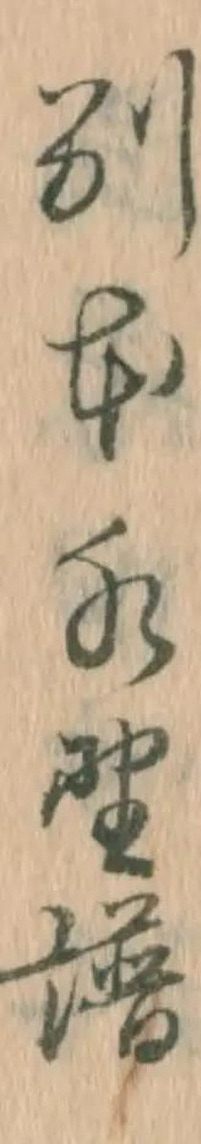別本水野譜
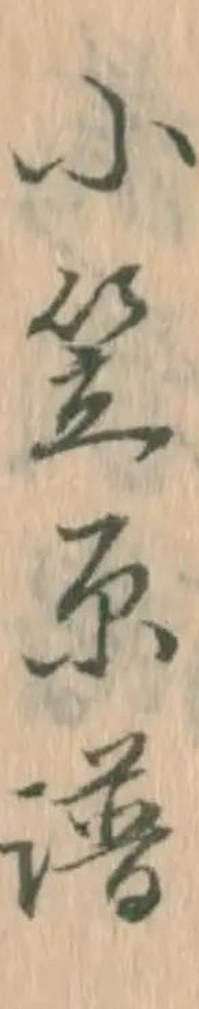小笠原譜
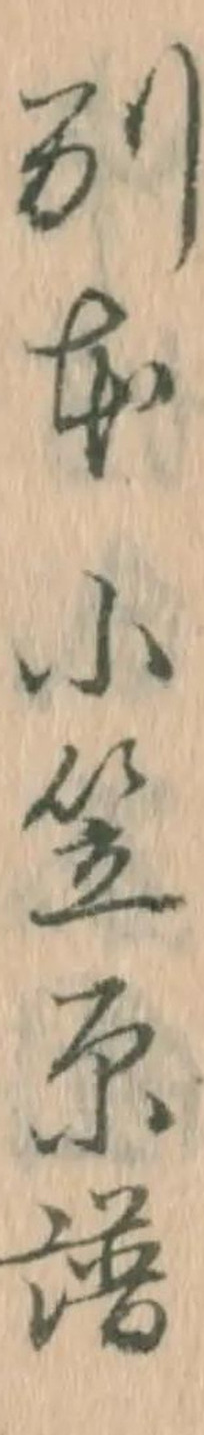別本小笠原譜
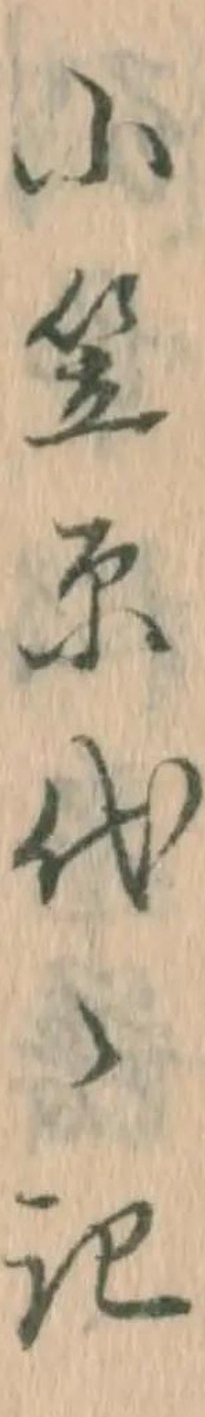小笠原代々記
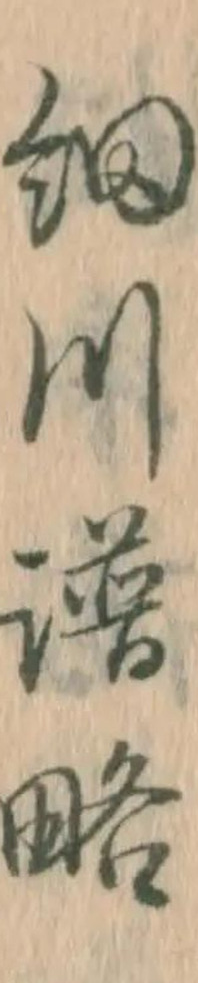細川譜略
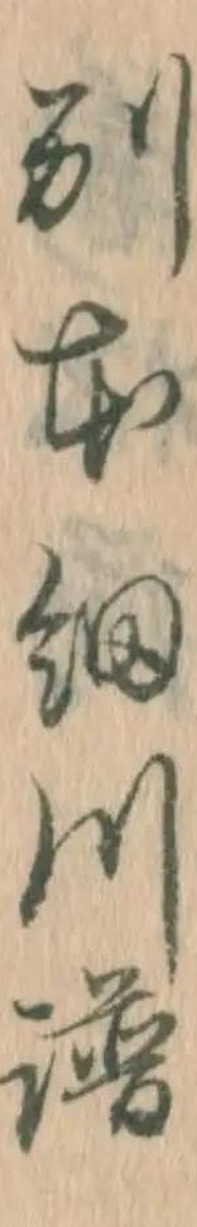別本細川譜
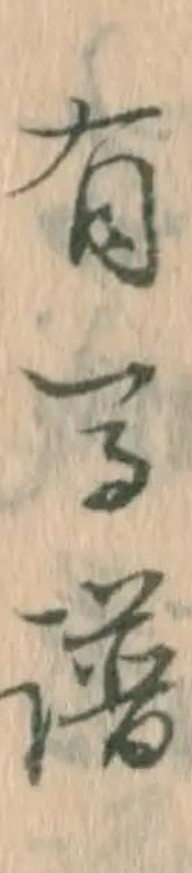有馬譜
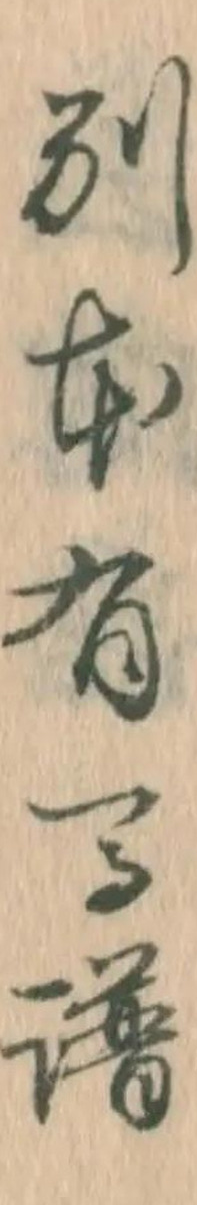別本有馬譜
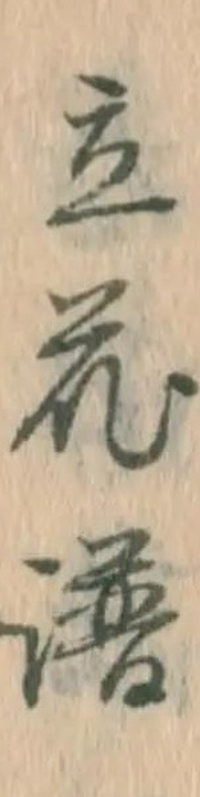立花譜
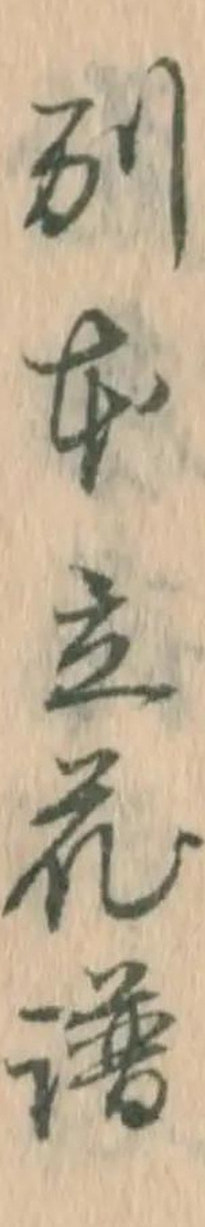別本立花譜
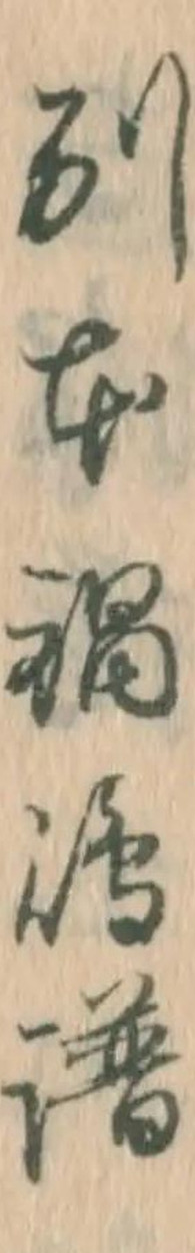別本鍋島譜

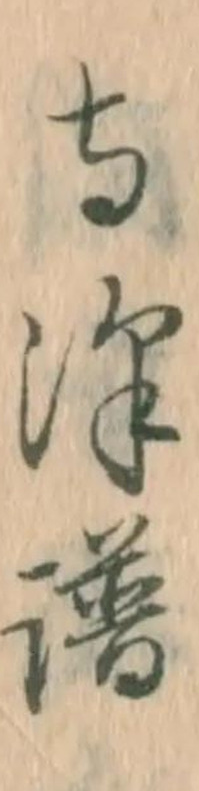寺沢譜
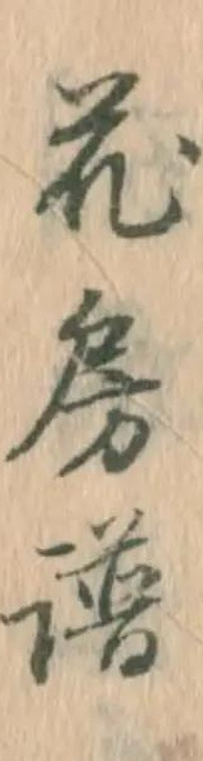花房譜
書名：切支丹御退治記 49巻. [1]
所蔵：国立国会図書館 National Diet Library, JAPAN
